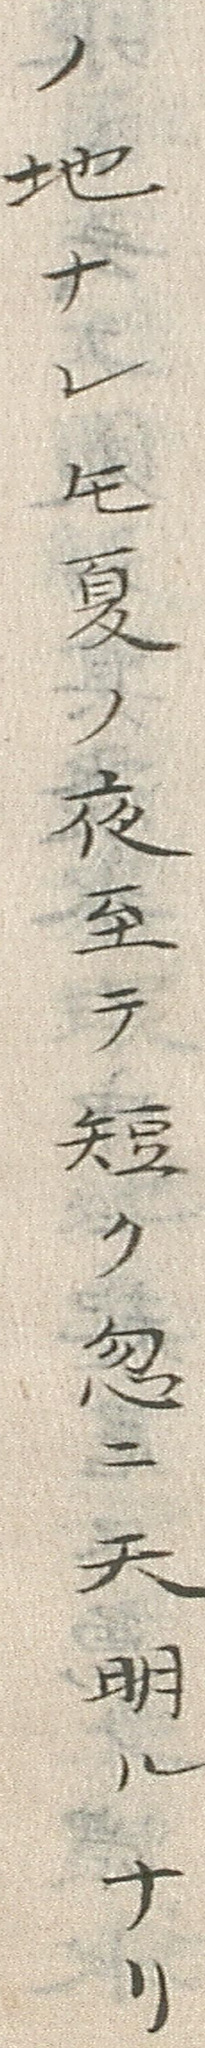ノ地ナレトモ夏ノ夜至テ短ク忽ニ天明ルナリ
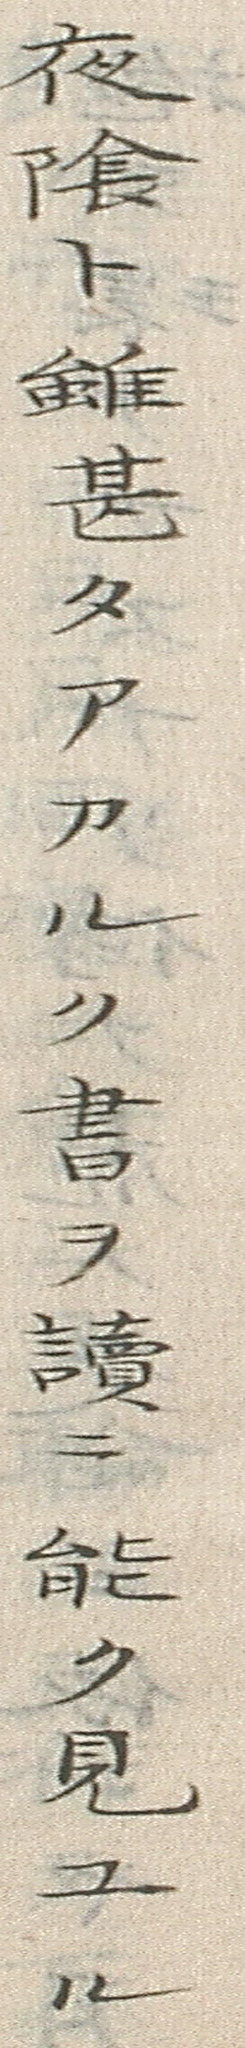夜陰ト雖甚タアカルク書ヲ読ニ能ク見ユル
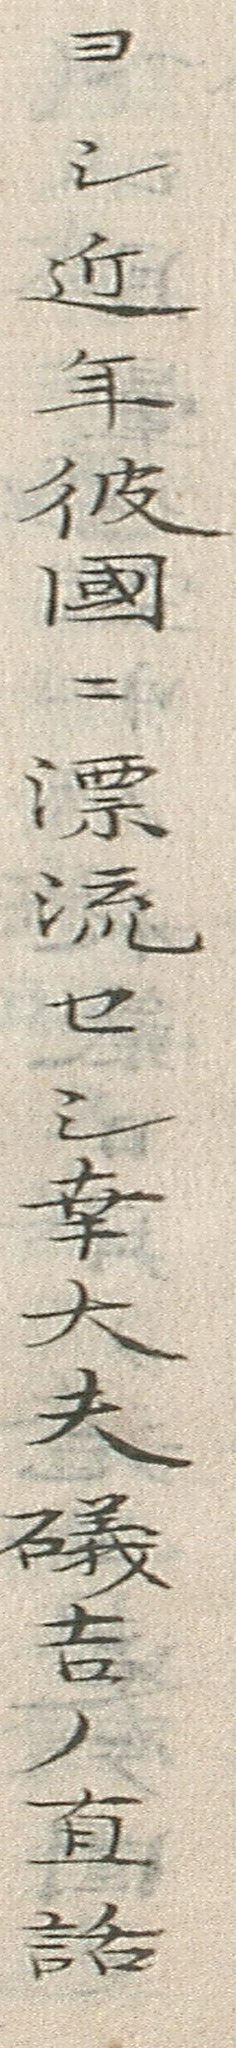ヨシ近年彼国ニ漂流セシ幸大夫礒吉ノ直話
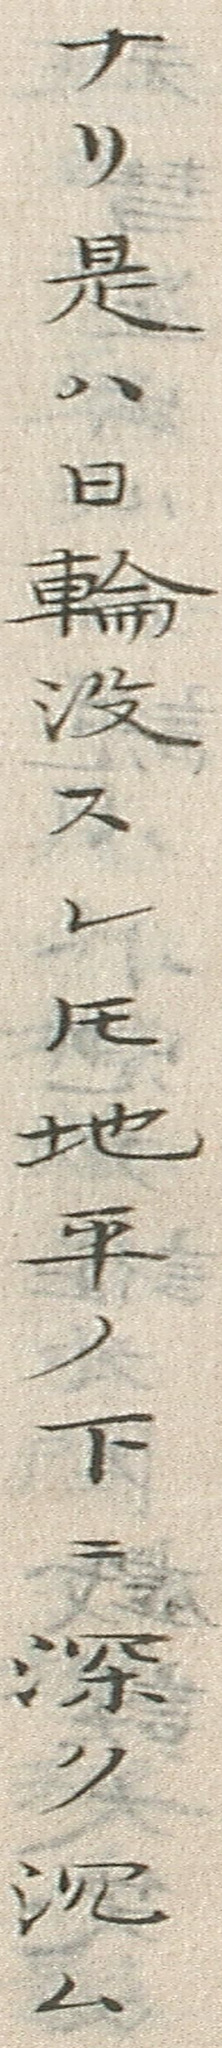ナリ是ハ日輪没スレトモ地平ノ下ニ深ク沈ム
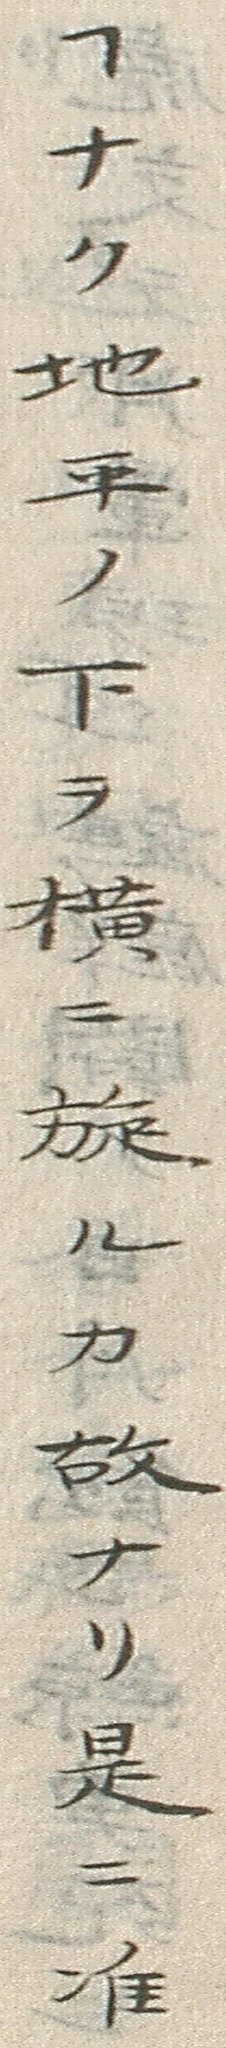コトナク地平ノ下ヲ横ニ旋ルカ故ナリ是ニ准
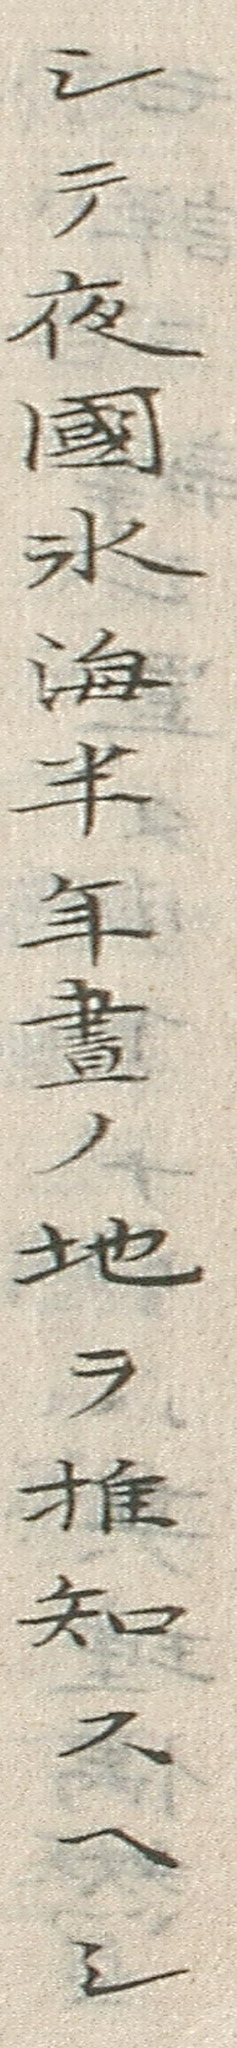シテ夜国氷海半年昼ノ地ヲ推知スヘシ
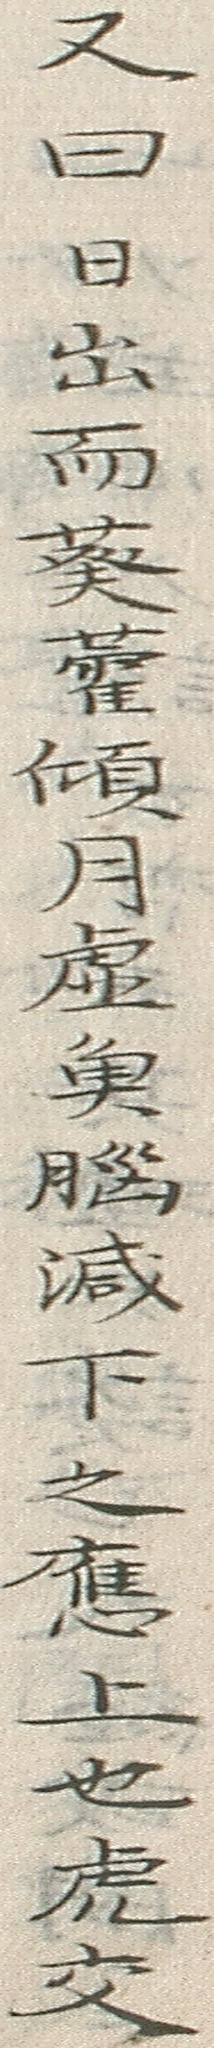又曰日出而葵蕾傾月虚魚脳減下之応上也虎交
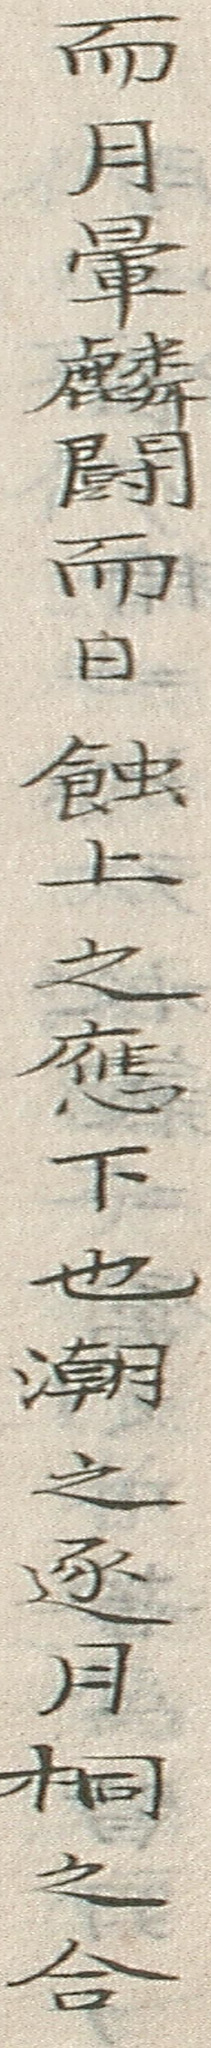而月暈麟闘而日蝕上之応下也潮之逐月桐之合
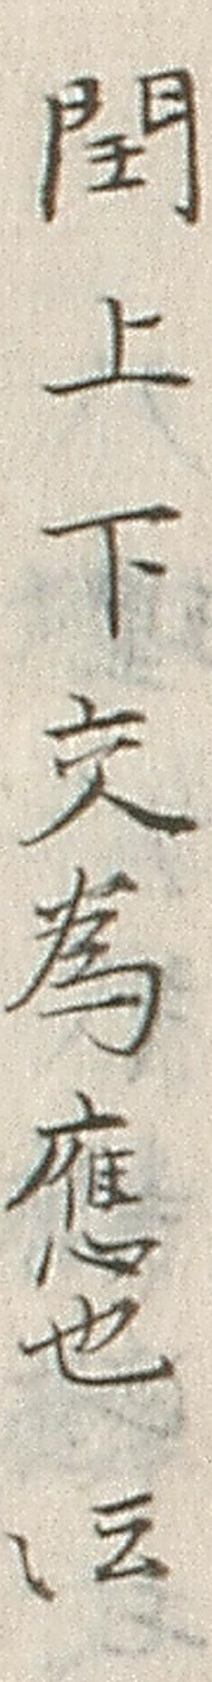閏上下交為応也云〻
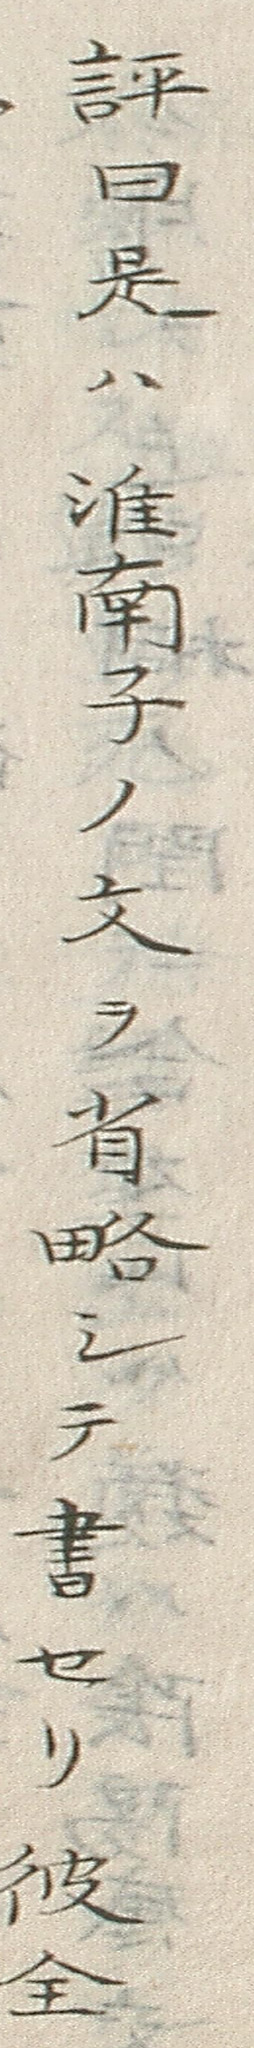評曰是ハ淮南子ノ文ヲ省略シテ書セリ彼全
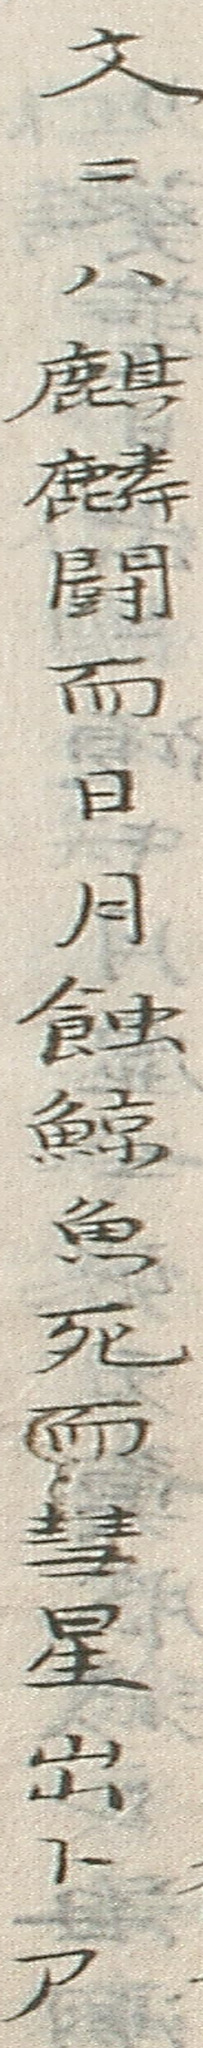文ニハ麒麟闘而日月蝕鯨魚死而彗星出トア

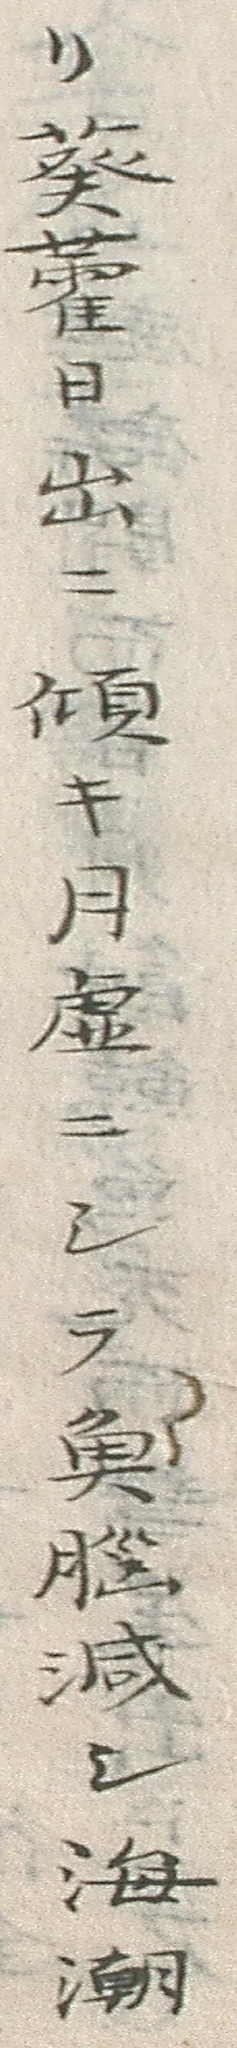リ葵蕾日出ニ傾キ月虚ニシテ魚脳減シ海潮
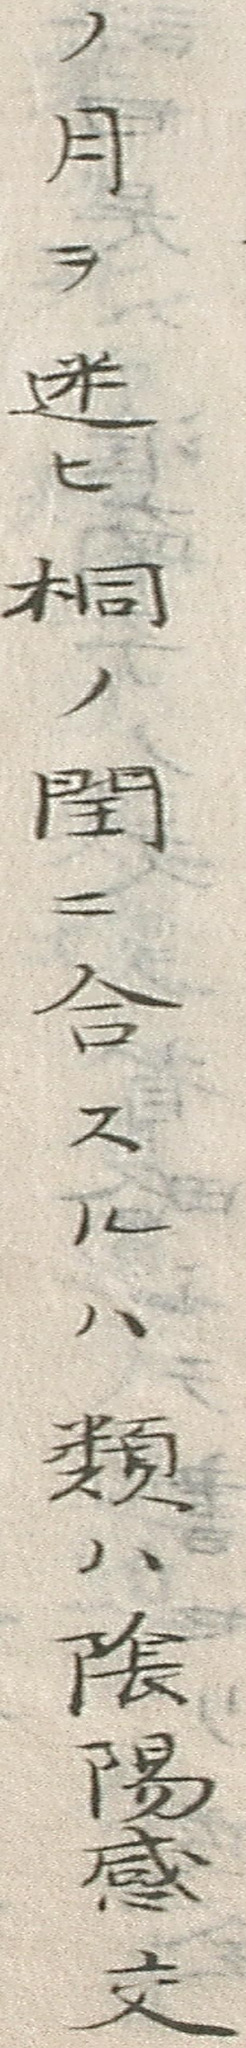ニ月ヲ迷ヒ桐ノ閏ニ合スルハ類ハ陰陽感交
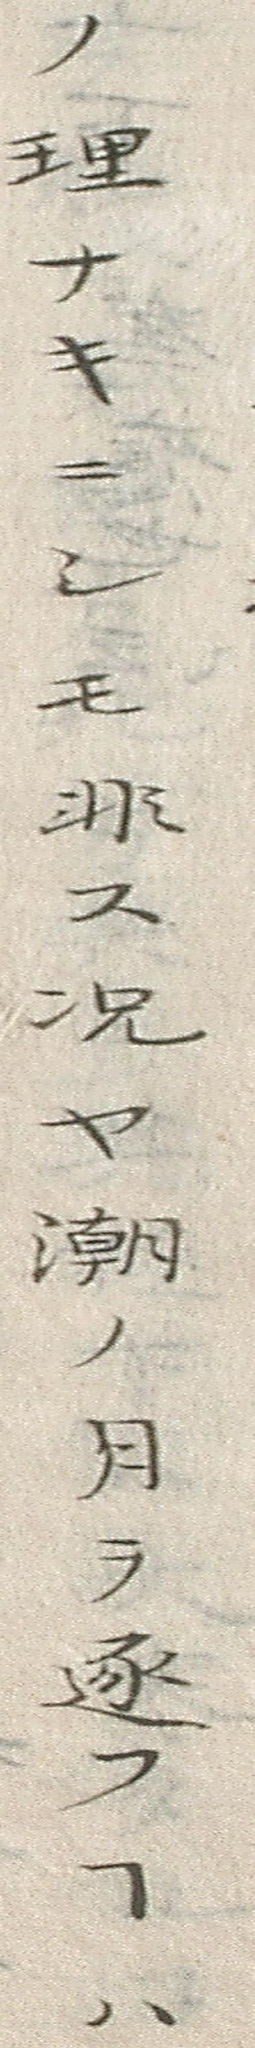ノ理ナキニシモ非ス況ヤ潮ノ月ヲ逐フコトハ
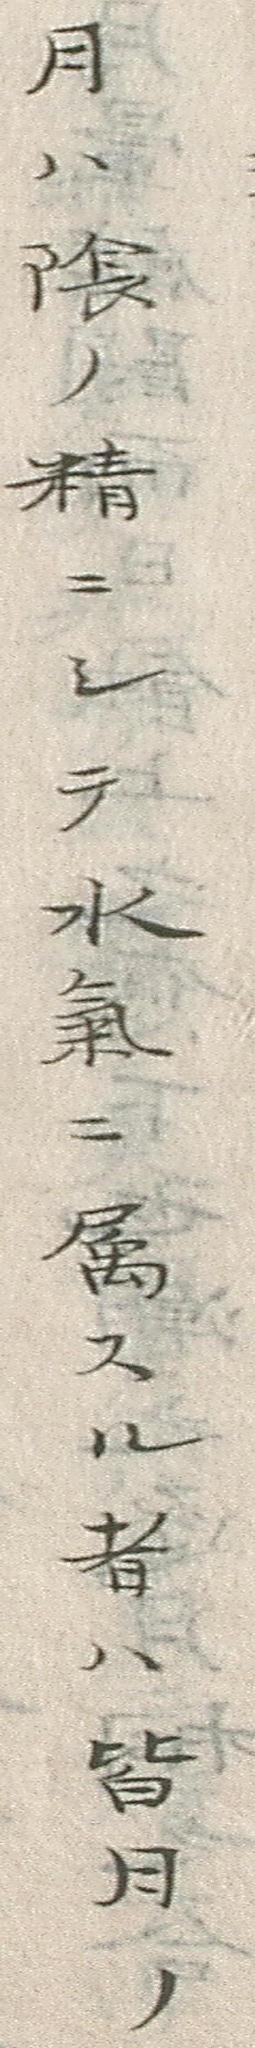月ハ陰ノ精ニシテ水気ニ属スル者ハ皆月ノ
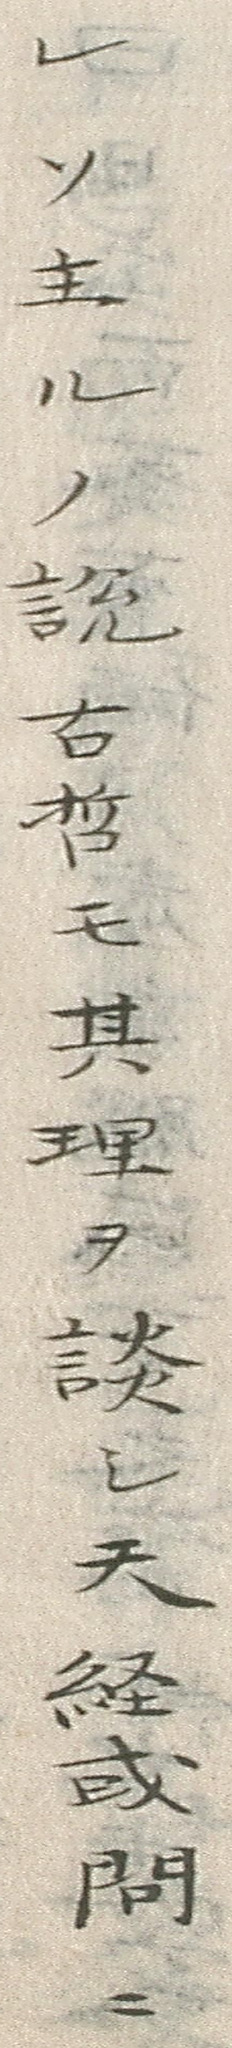レソ主ルノ説古哲モ其理ヲ談シ天経或問ニ
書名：天學略名目羽翼　全
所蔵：東京大学地震研究所図書室 Earthquake Research Institute Library, The University of Tokyo, JAPAN
